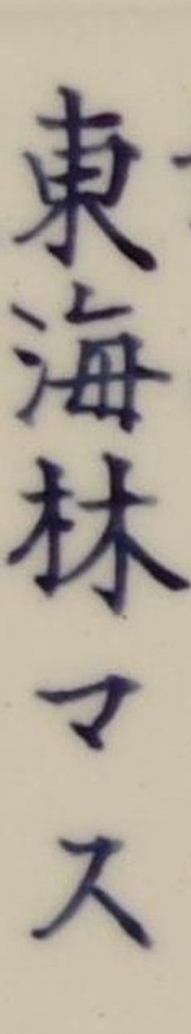東海林マス
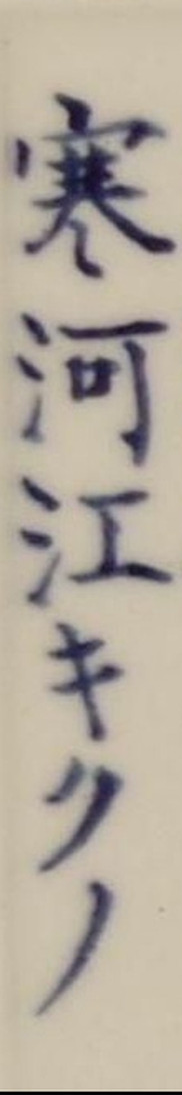寒河江キクノ

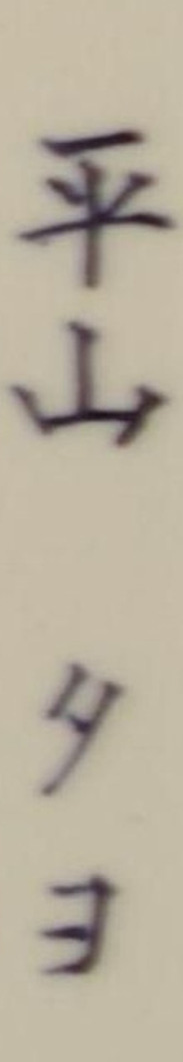平山タヨ
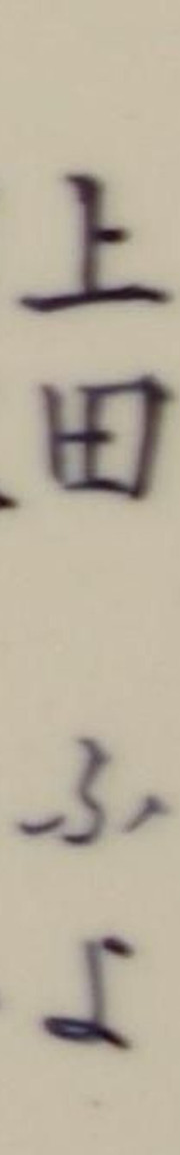上田ふよ
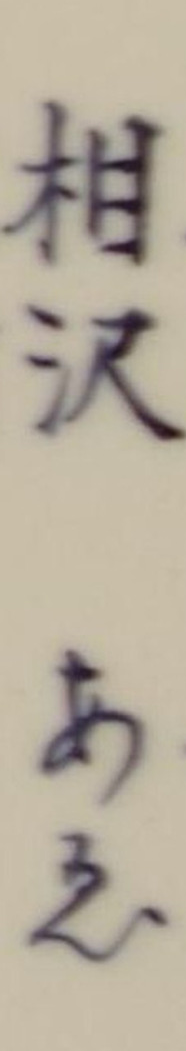相沢あゑ
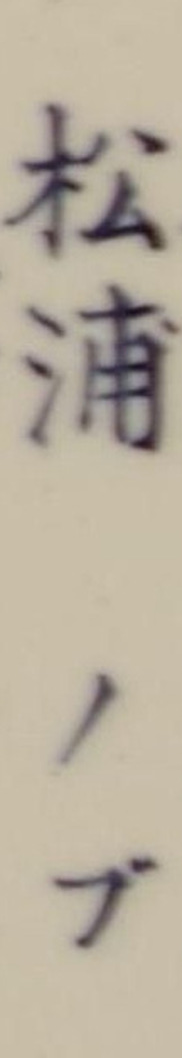松浦ノブ
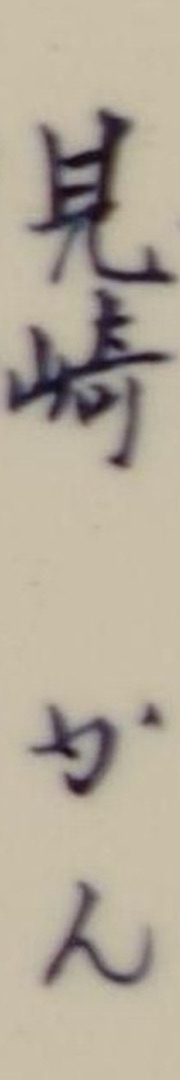見崎かん
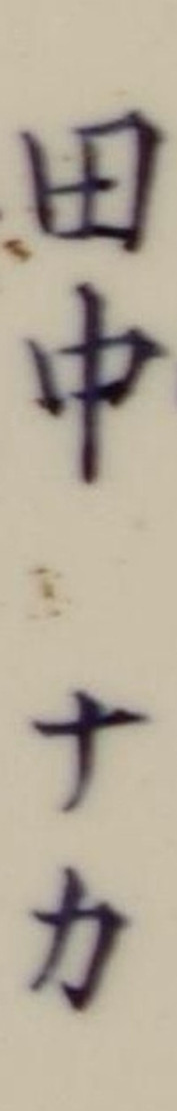田中ナカ
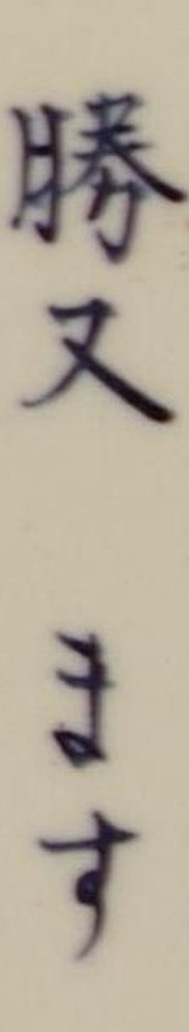勝又ます
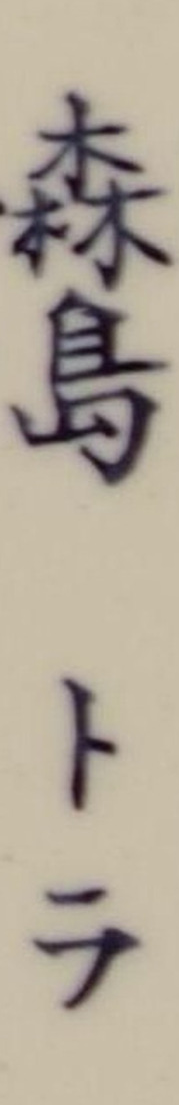森島トラ
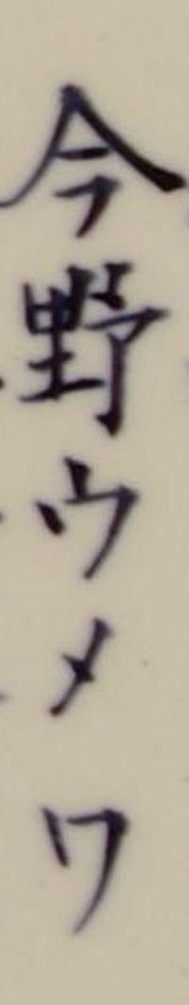今野ウメワ
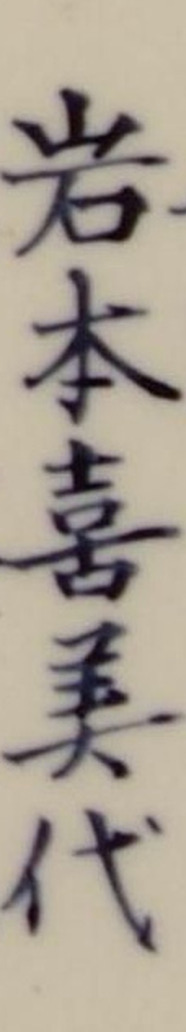岩本喜美代
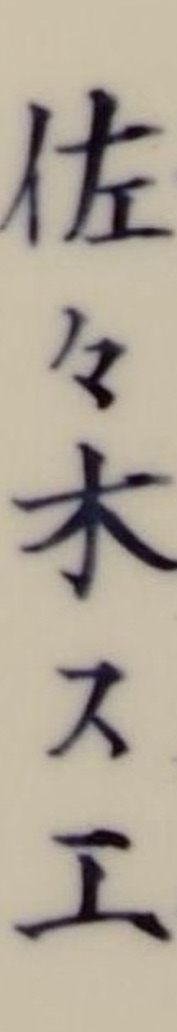佐々木ス工
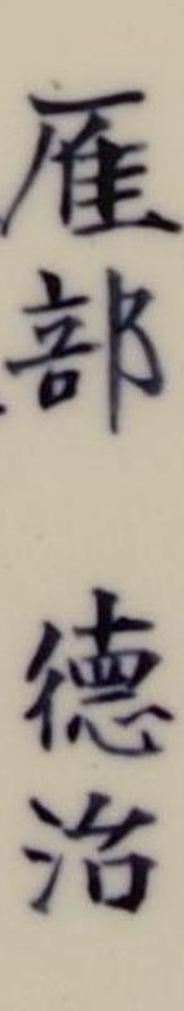雁部徳治
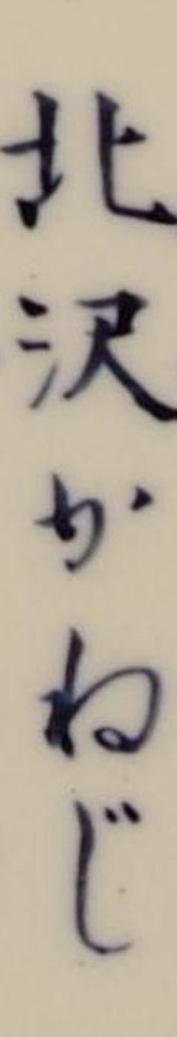北沢かねじ
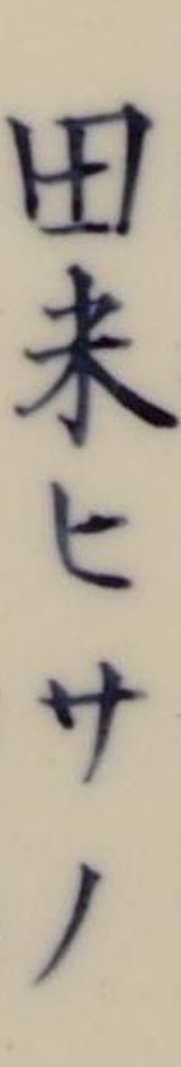田米ヒサノ
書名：M~S
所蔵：高野山金剛峯寺
